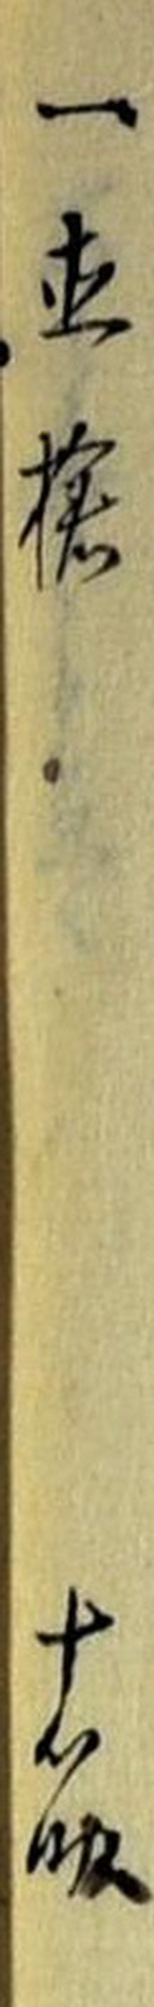一直槍十筋
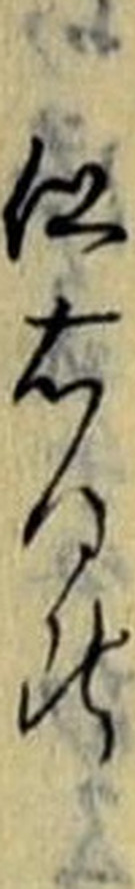但右同断
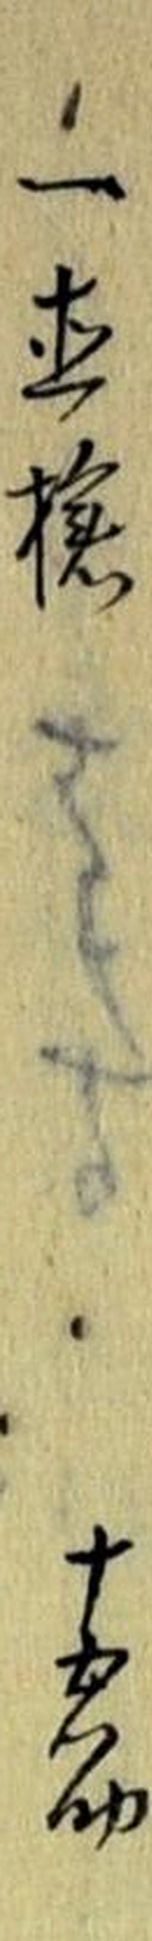一直槍十筋
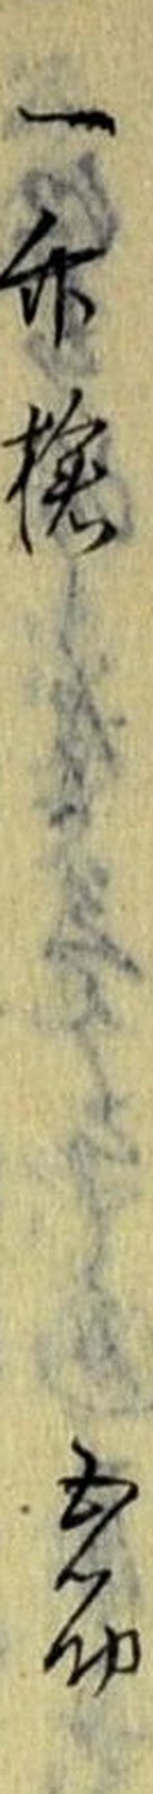一竹槍五筋
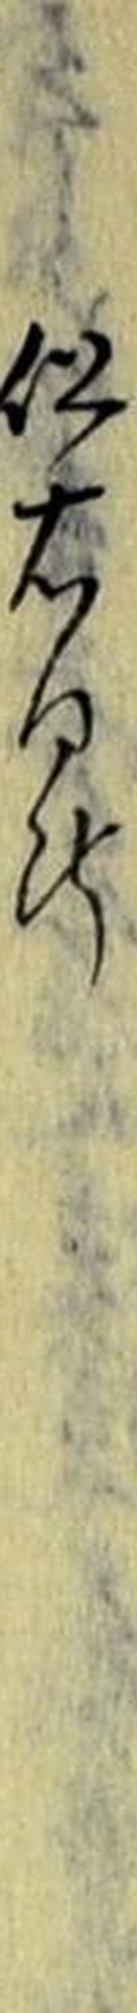但右同断
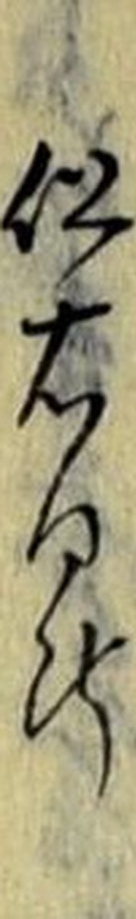但右同断
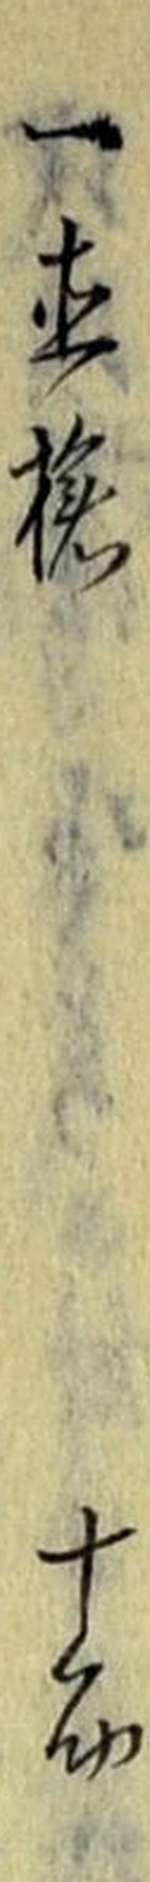一直槍十筋
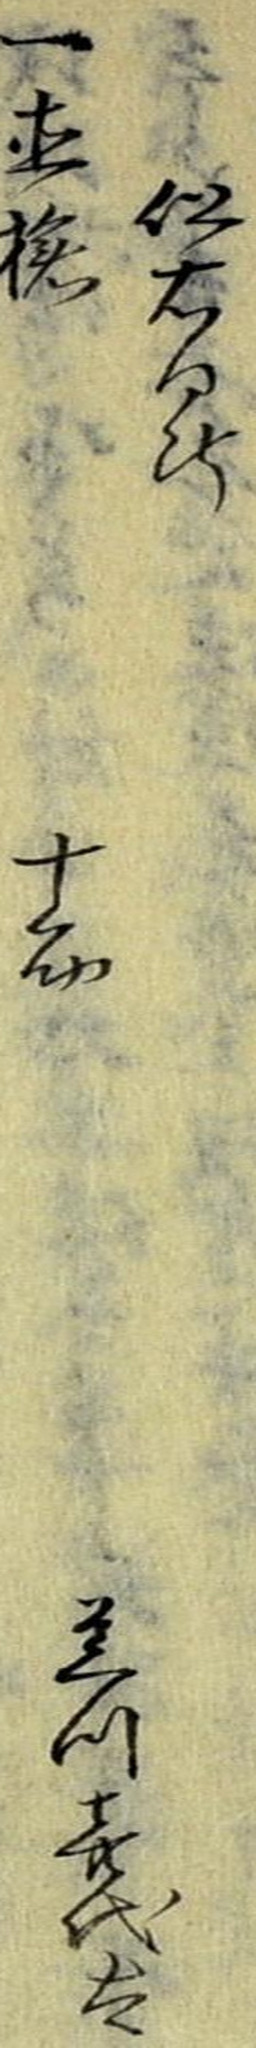一直槍十筋黒川喜代太
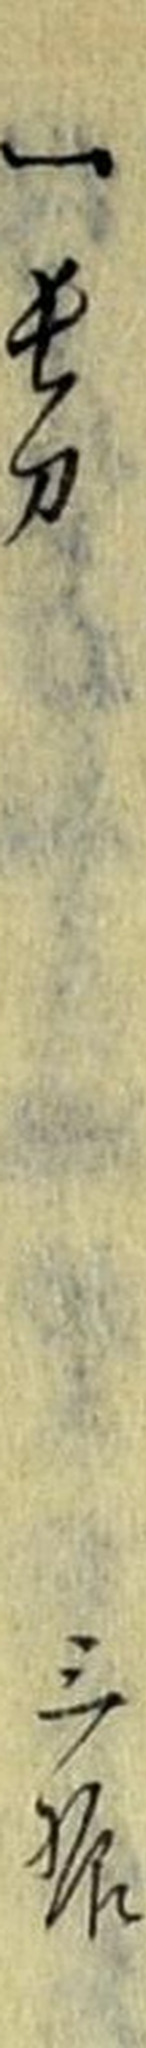一長刀三振
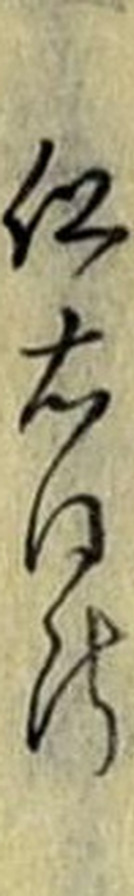但右同断
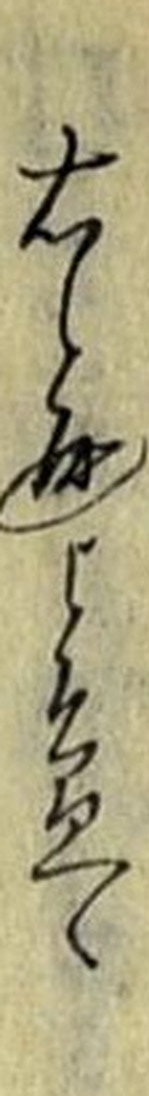右之通被下置候
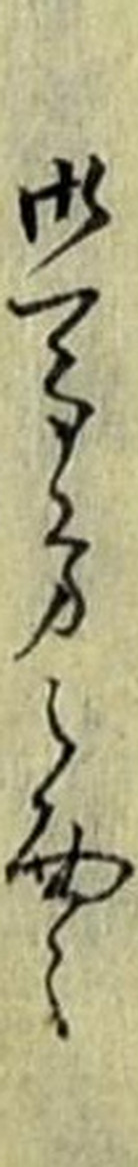御馬方之面々
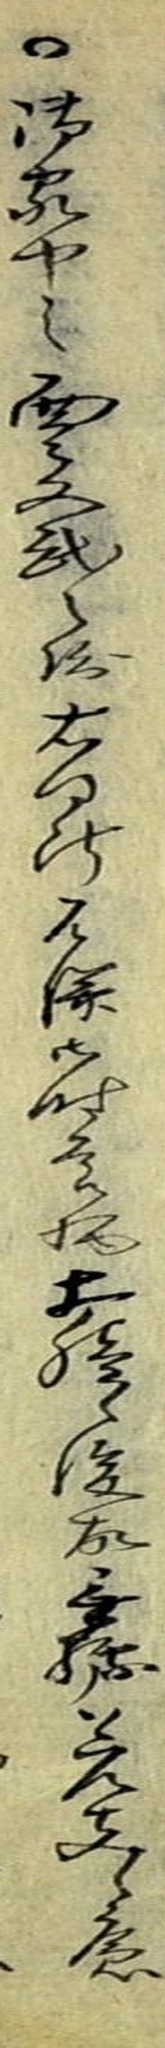○御家中之面々文武之儀右同断乍併御時節柄相続候後故無拠差支之廉
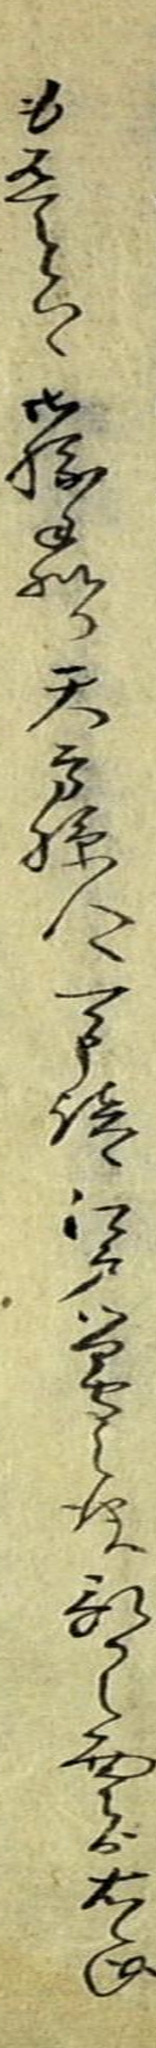も有之候はヽ御勝手掛り天方孫八へ可申談候江戸留守之儀は預り之面々ゟ右之趣
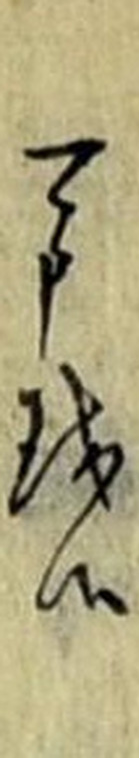可申越候
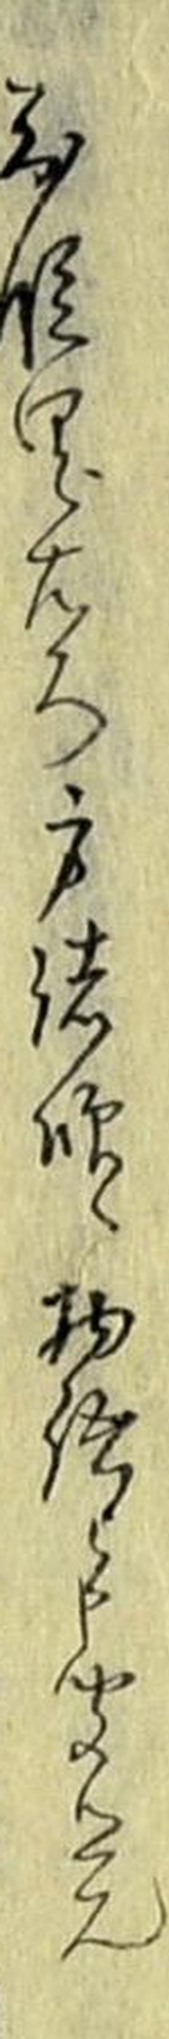別段四郎左衛門方諸師へ物語被申聞候覚
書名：命令之部 六
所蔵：福井県文書館 Fukui Prefectural Archives
